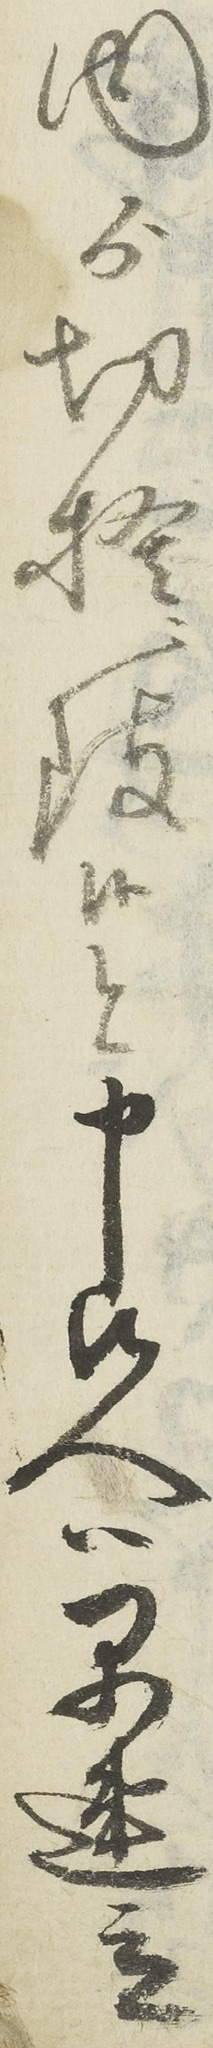内ゟ切捨ニ致候と申候へは早速立

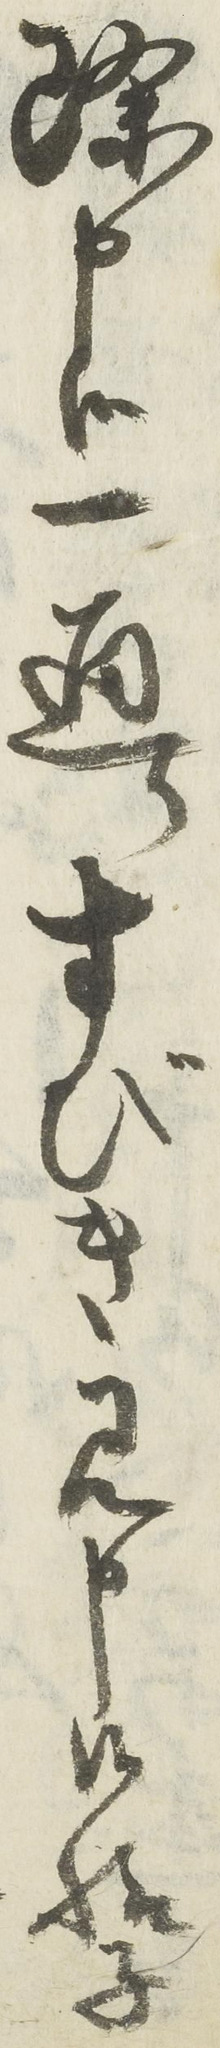除申候一通りすびき見申候様子
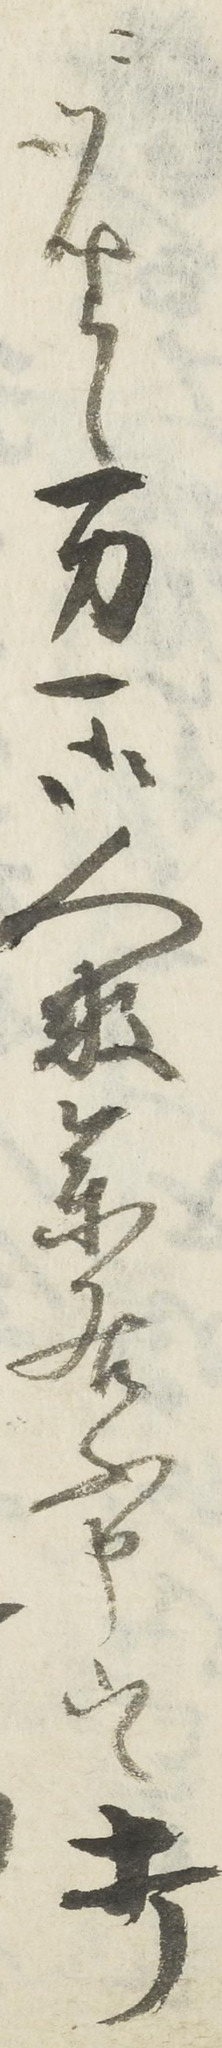ニ御坐候万一御人数参居不申候はヽ打
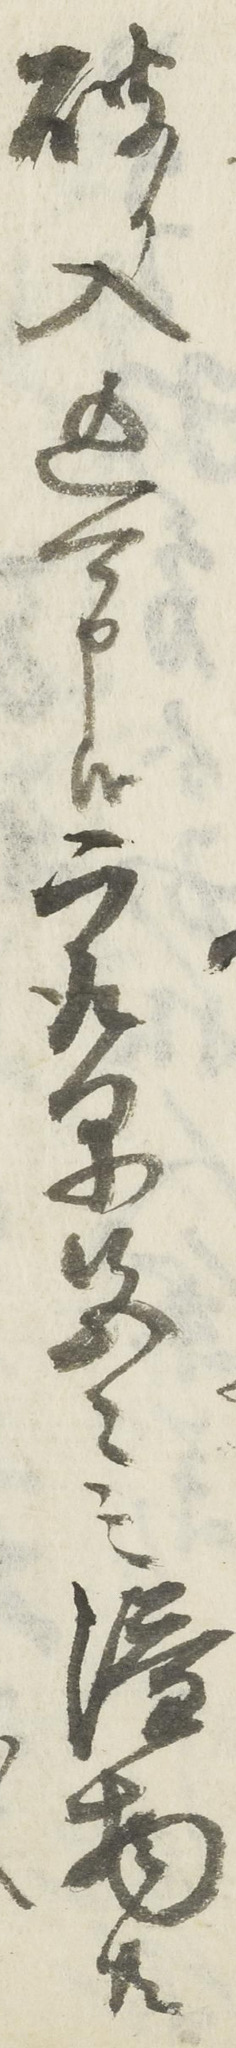破り入込可申候最早色〻之溢物共
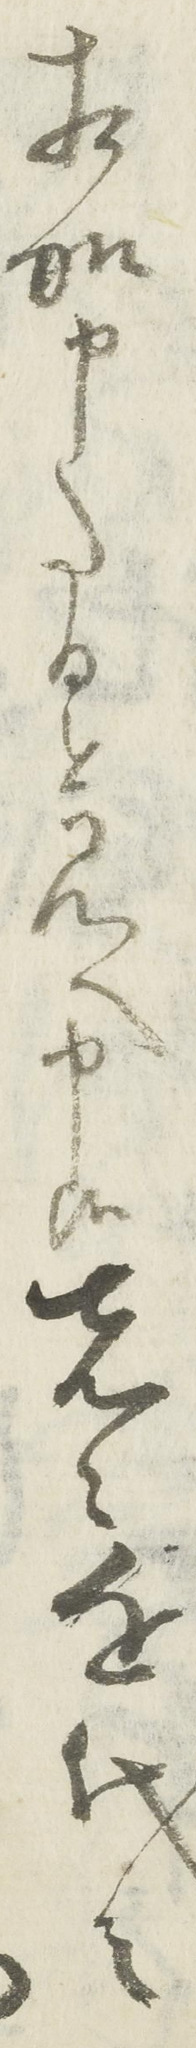相加申たると見へ申候先〻近代之
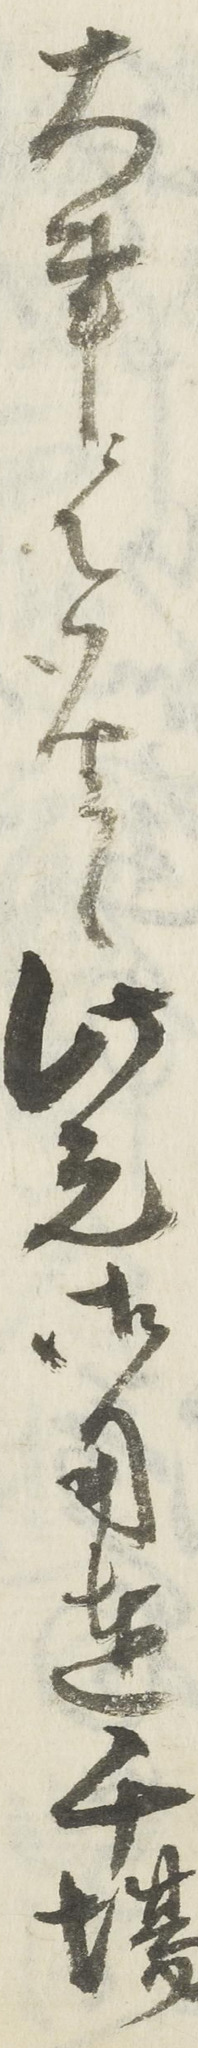大事ニて御坐候此元御用達千場
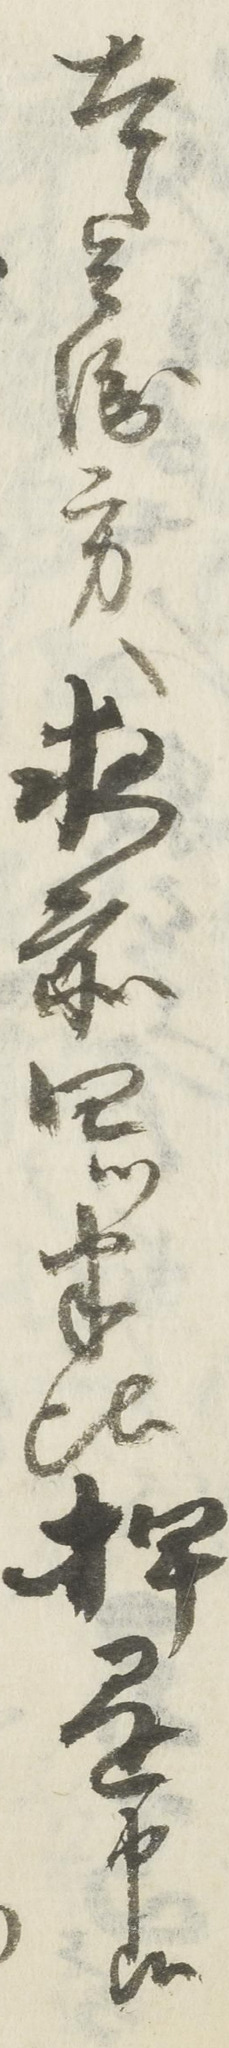太郎兵衛方へ夜前四つ半比押懸申候
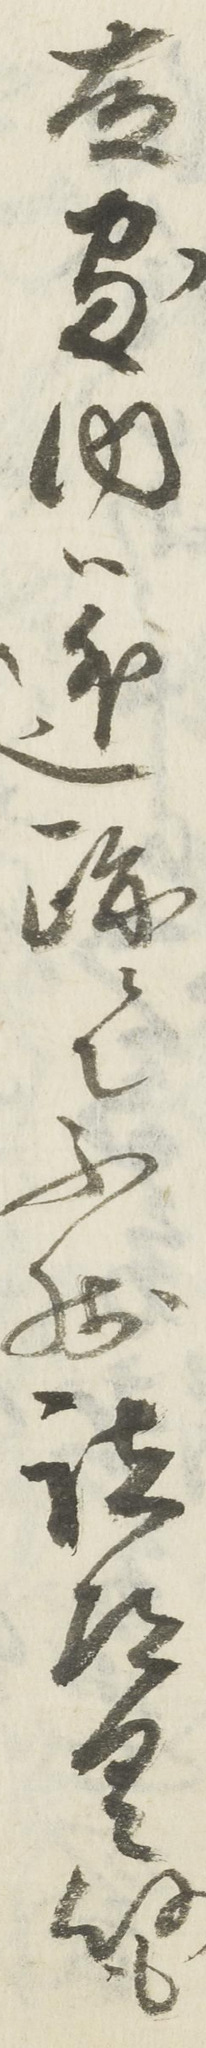故家内は逃跡ニて不残諸道具何も
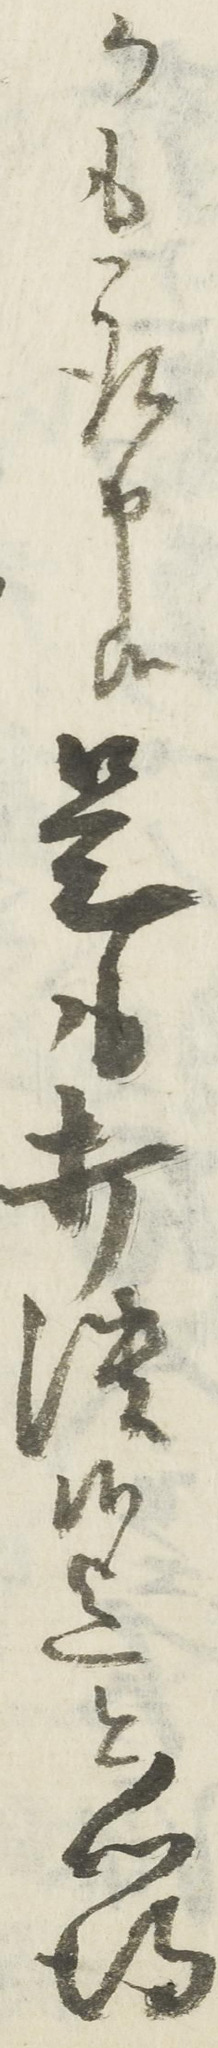かも取申候是も打潰候迄と心得
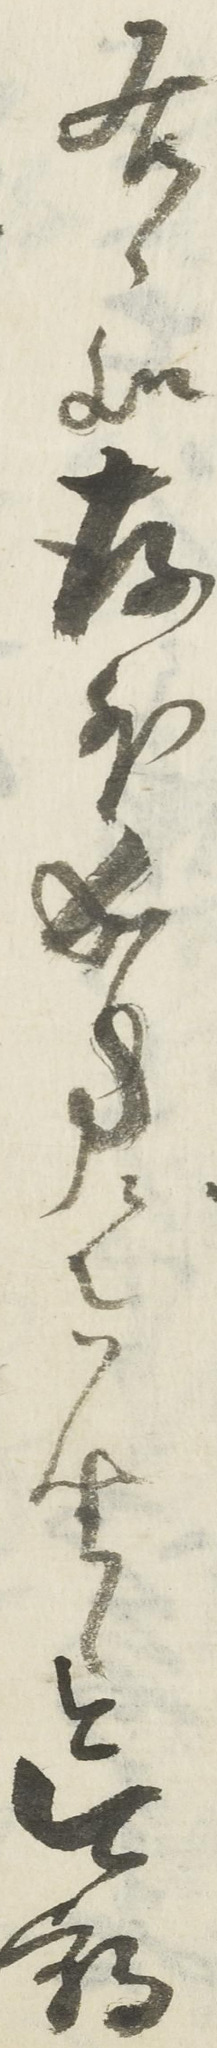居候処存外成事ニて御坐候と今朝
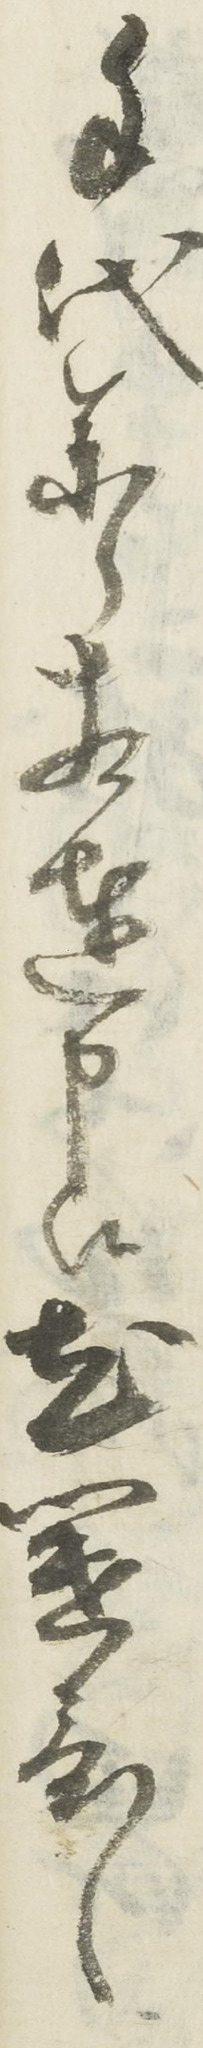手代参り相達申候尤心遣置し
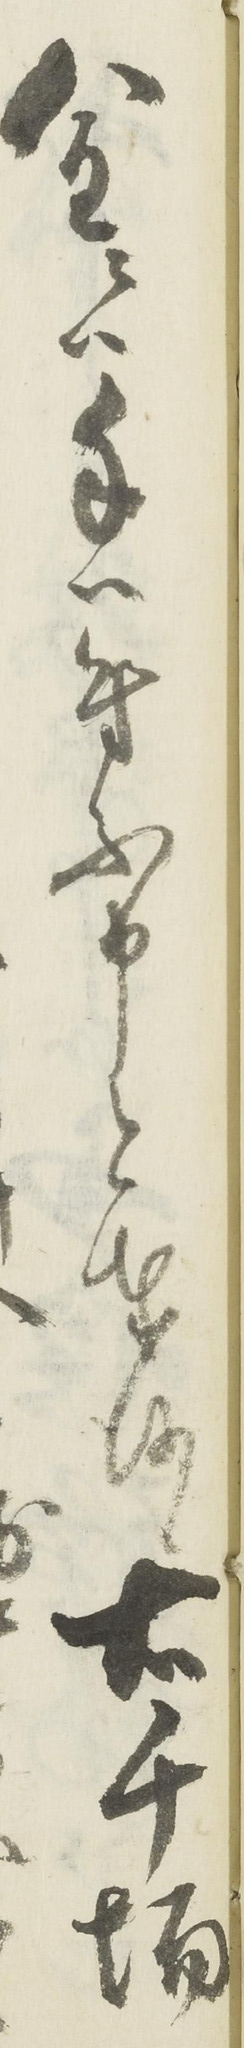金ニは手は付不申と奉存候右千場
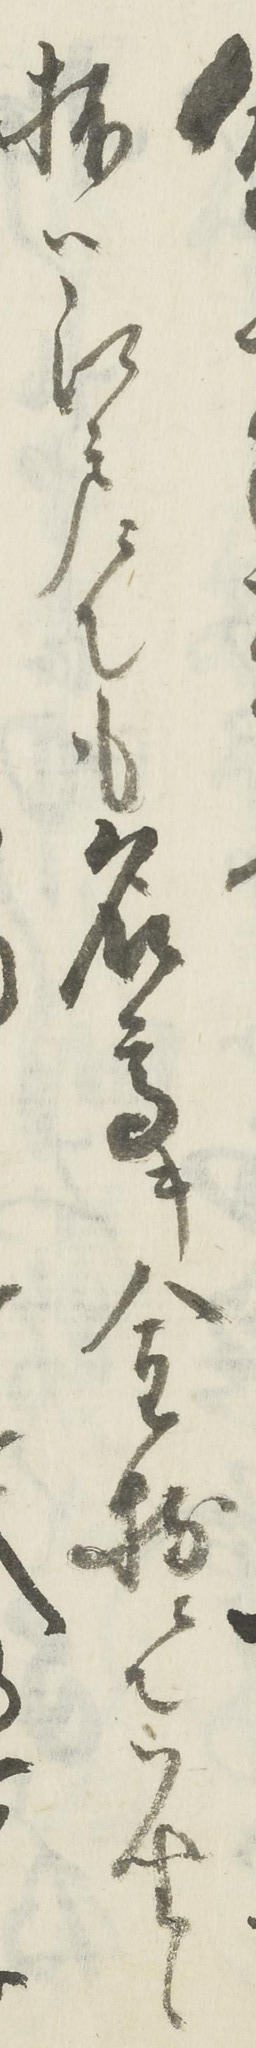抔は江戸ニても名高キ金持ニて御坐候
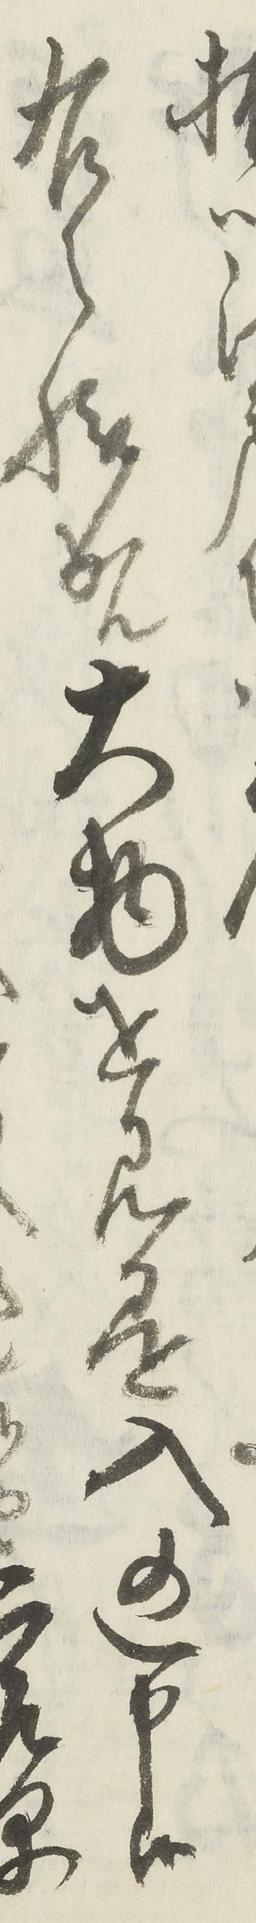右之様成ル大物を見懸入込申候
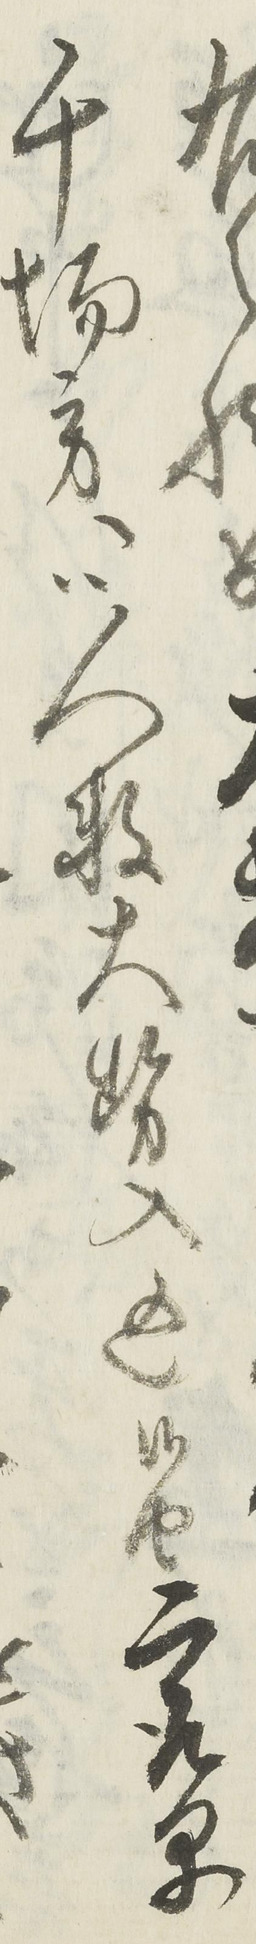千場方ヘは人数大勢入込候由最早
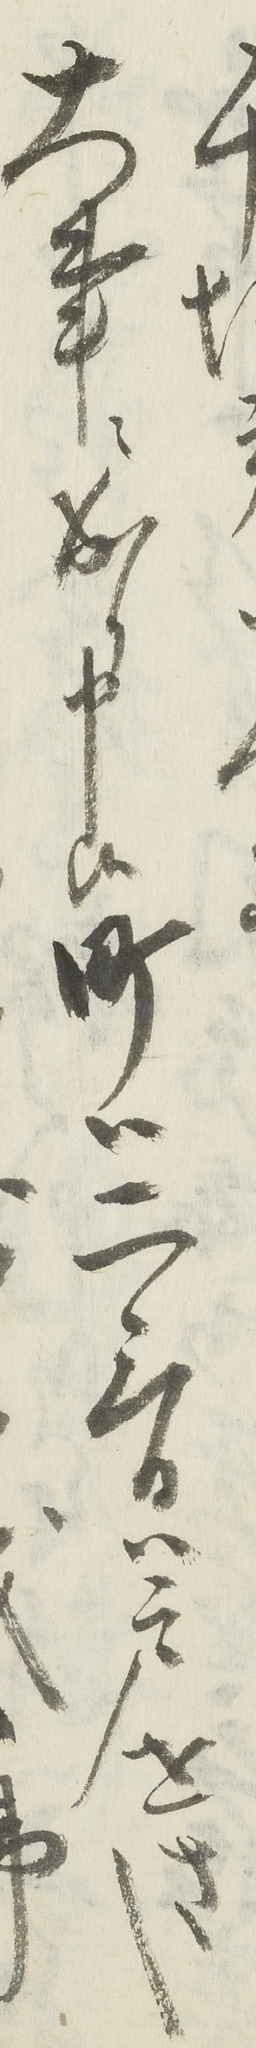大事ニ成り申候町はニ三日戸とさし
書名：後見笑
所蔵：東京大学地震研究所図書室 Earthquake Research Institute Library, The University of Tokyo, JAPAN
